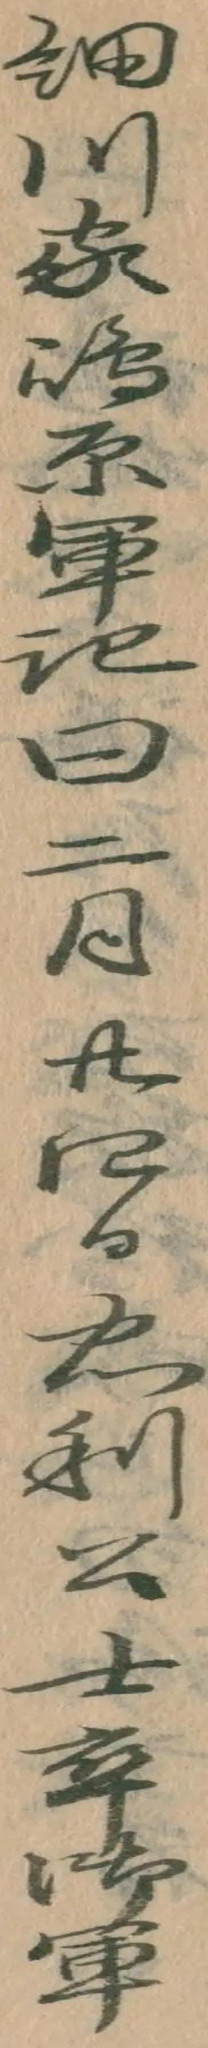細川家島原軍記曰二月廿四日忠利公士卒御軍
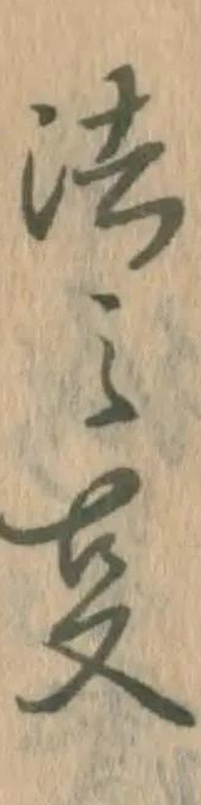法之事
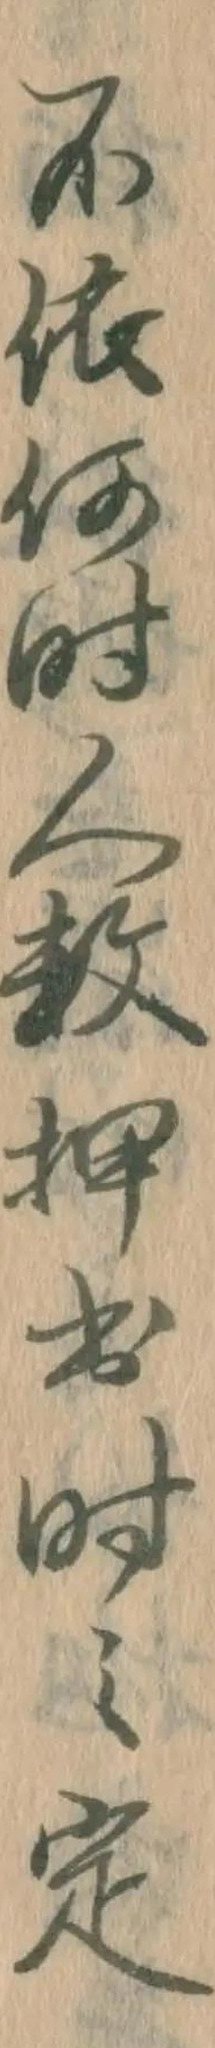不依何時人数押出時之定
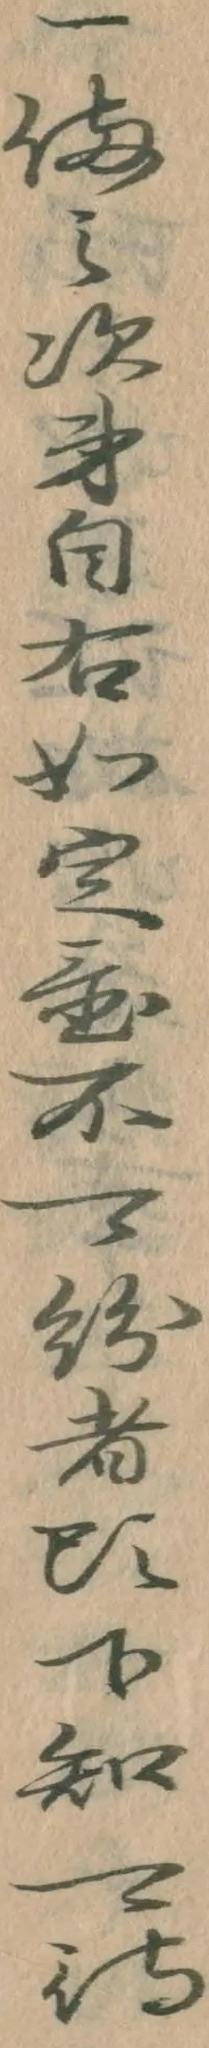一備之次第自右如定置不可紛者頭下知可待
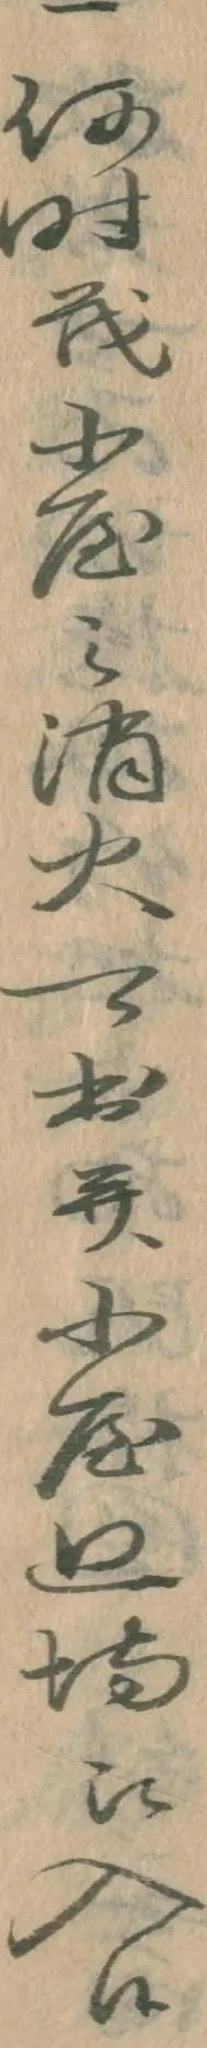一何時茂小屋之消火可出幷小屋廻場江入候
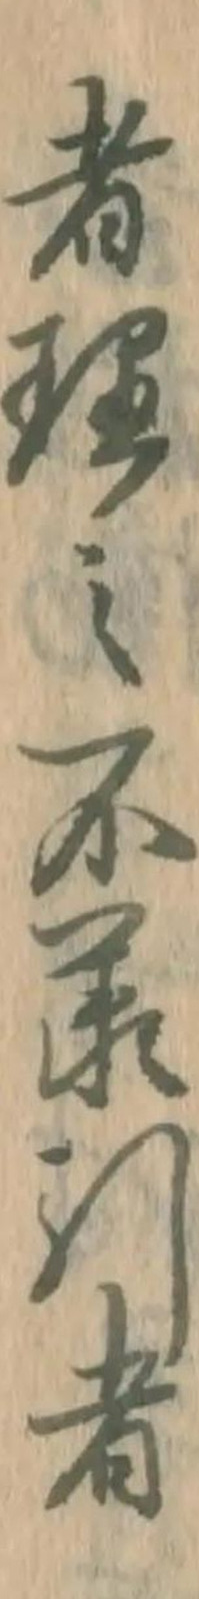者理之不承引者

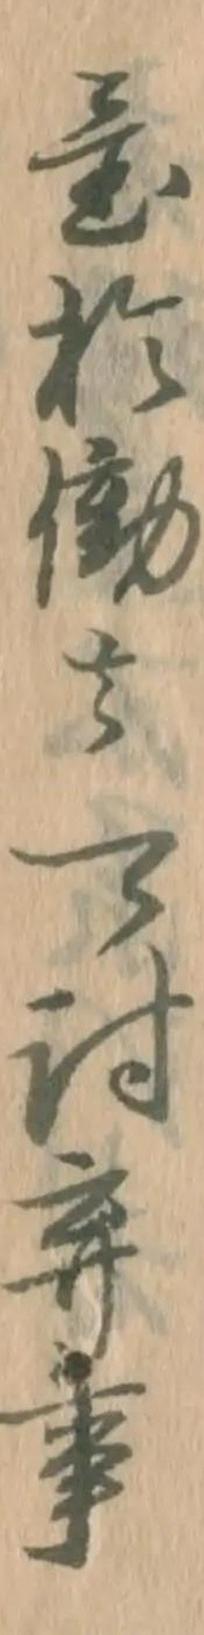置於働者可討弃事
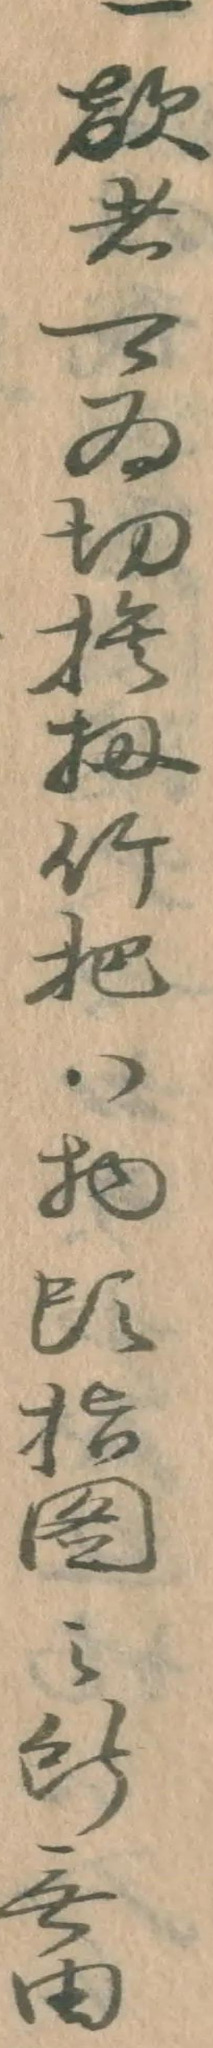一敵者可ゐ切捨扨竹把は物頭指図之所無由
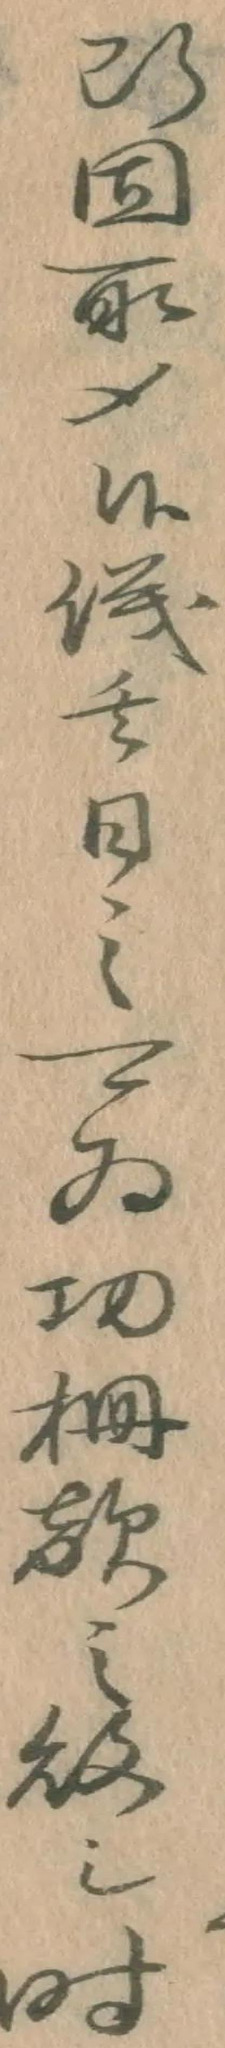断固取〆候儀其日之可ゐ功柵敵之敗し時
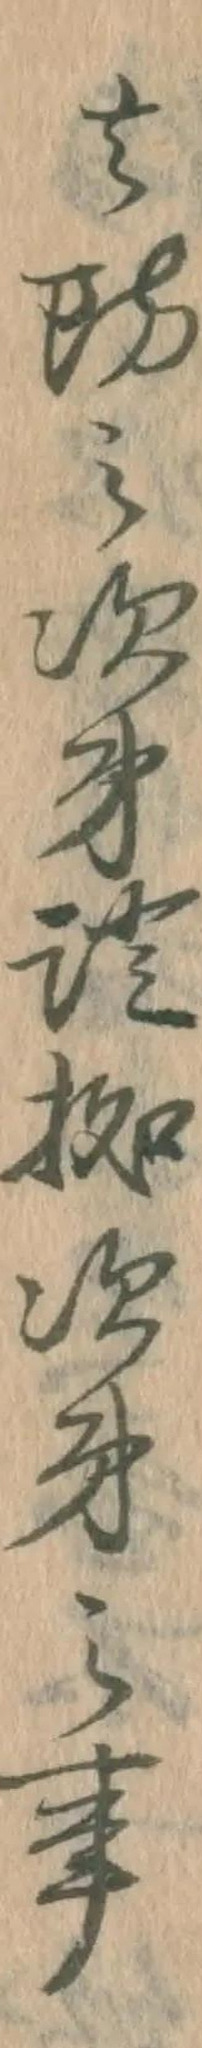者防之次第證拠次第之事
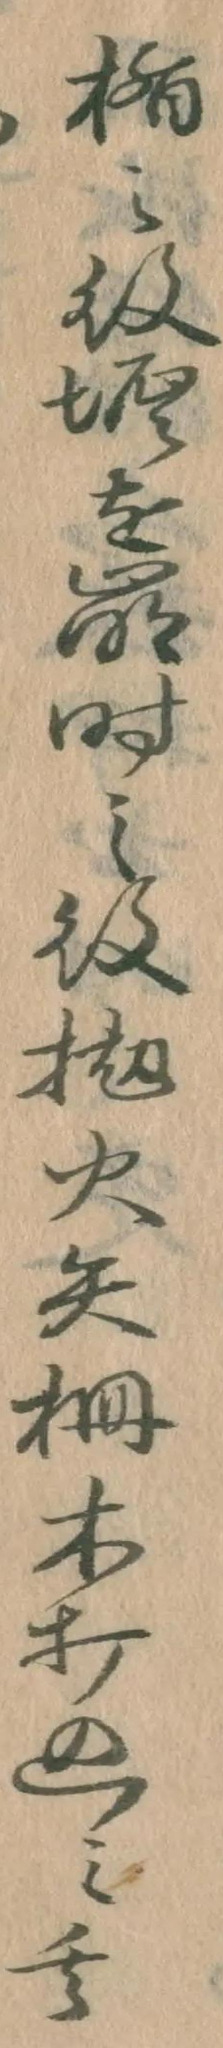一楯之役掘を崩時之役抛火矢柵木打込み其
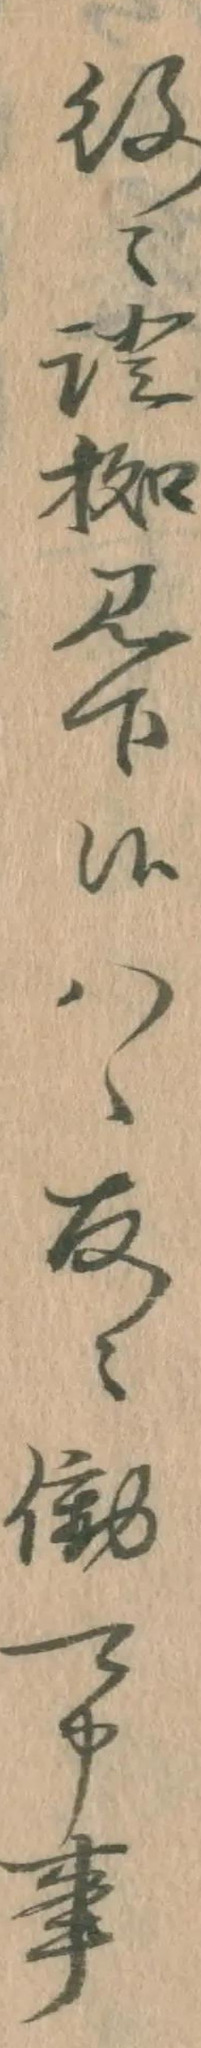級之證拠見下候はゝ友に働可申事
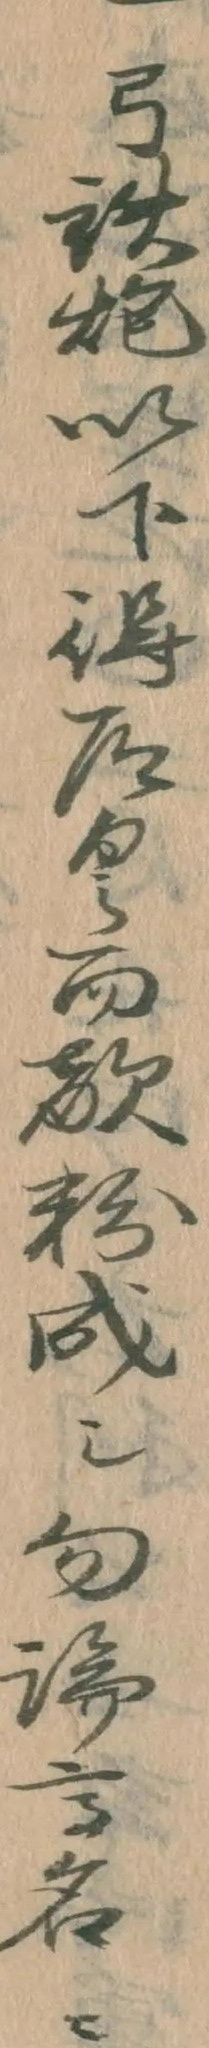一弓鉄炮以下得道具而敵粉成し勿論高名に
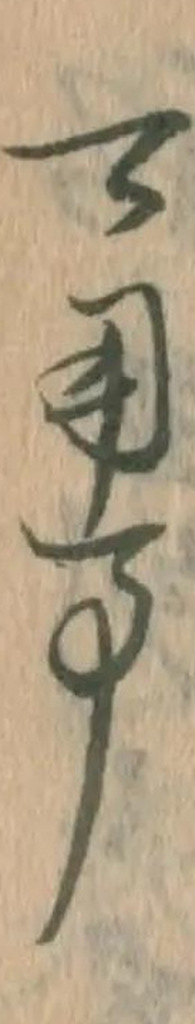可用事
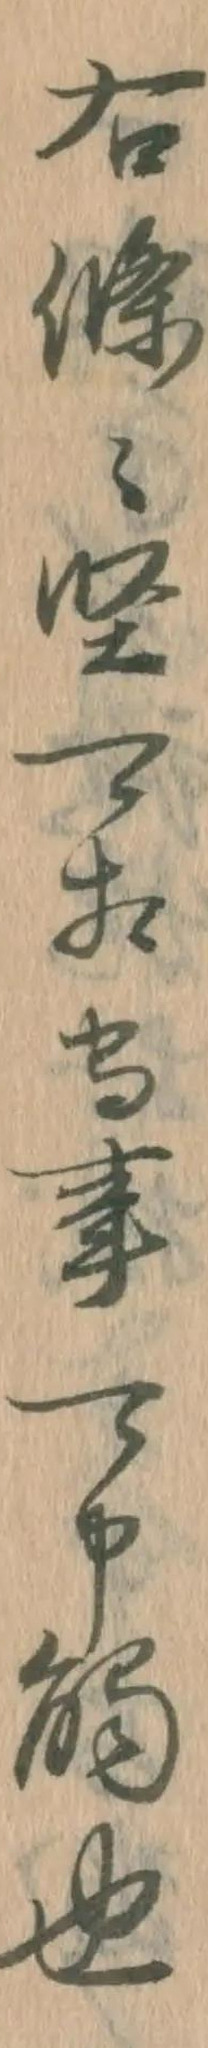右條に堅可相守事可申觸也
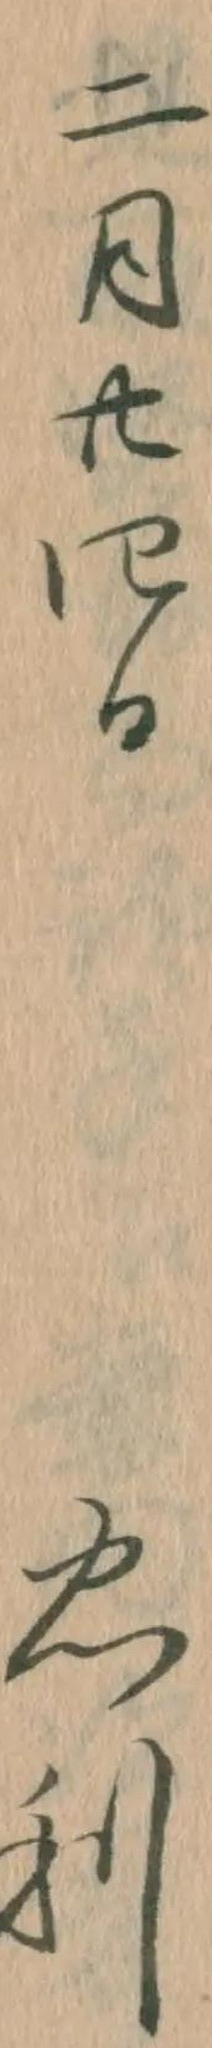二月廿四日忠利
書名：切支丹御退治記 49巻. [7]
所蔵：国立国会図書館 National Diet Library, JAPAN
